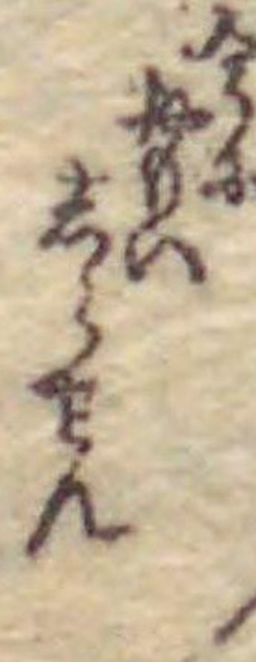しらせん
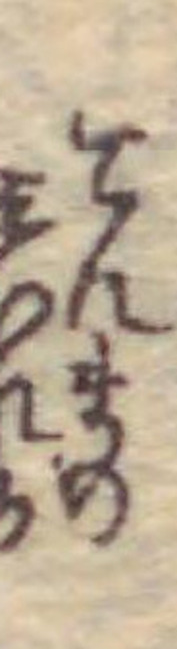みいれか
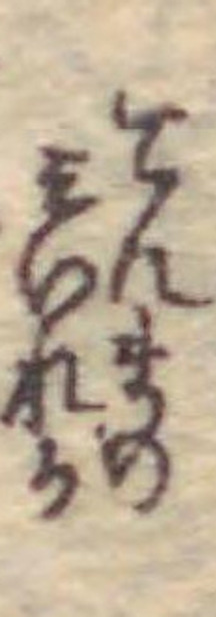みいれか
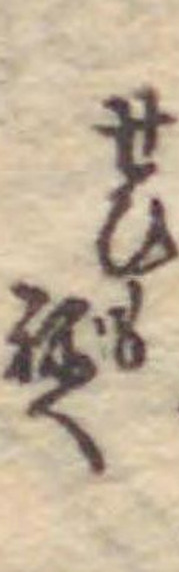せひも
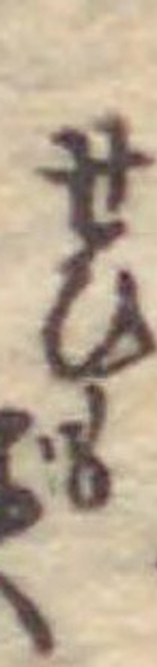せひも
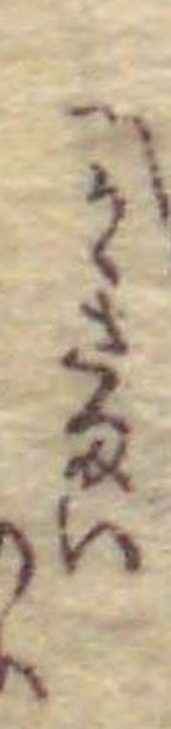〽かゝさまい

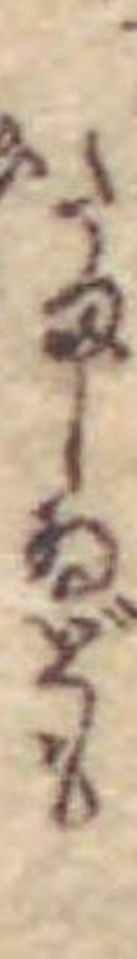たましゐども
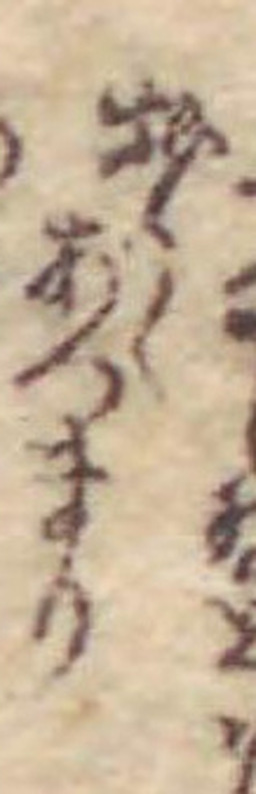あつまり
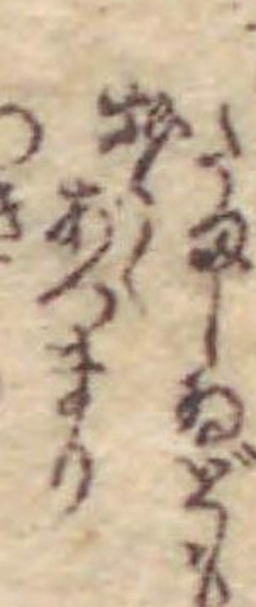あつまり
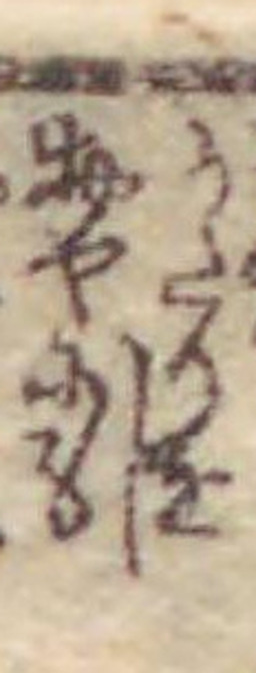おやにも
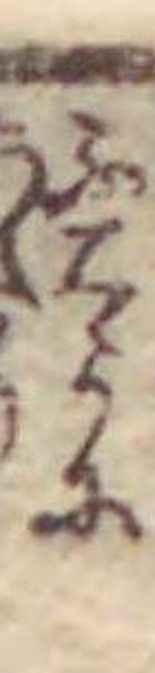ふこうに
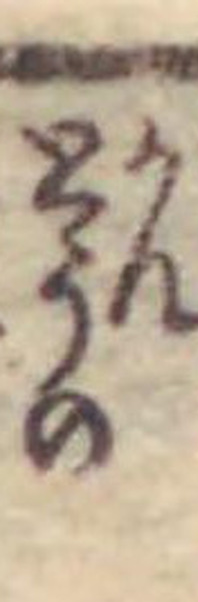とうの
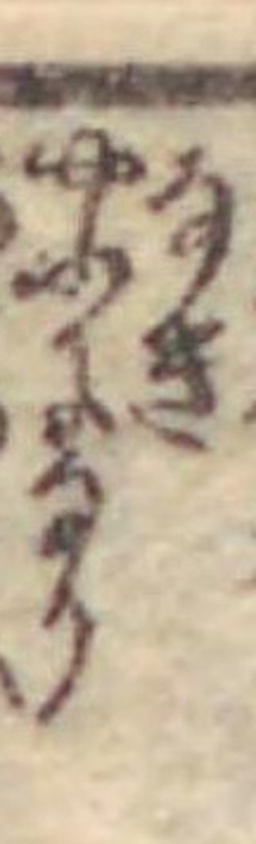やふになり
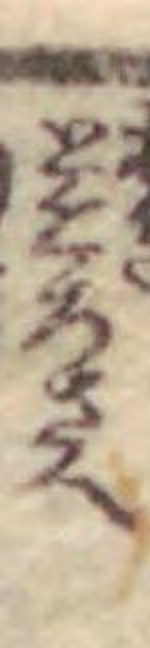ところさへ
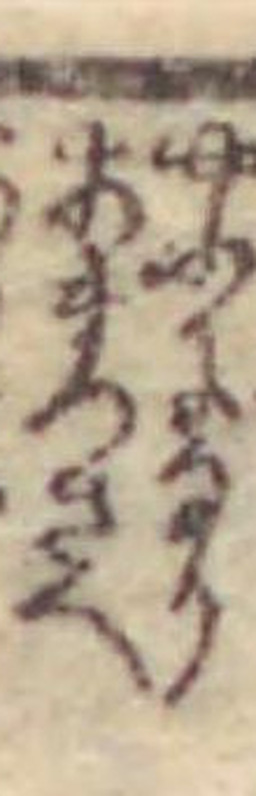あまつさへ
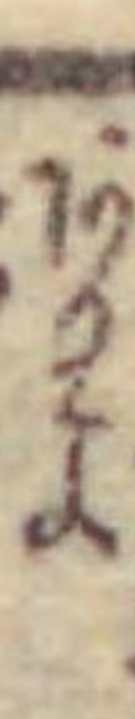あるよ
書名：心学早染艸 : 3巻
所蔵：国立国会図書館 National Diet Library, JAPAN
